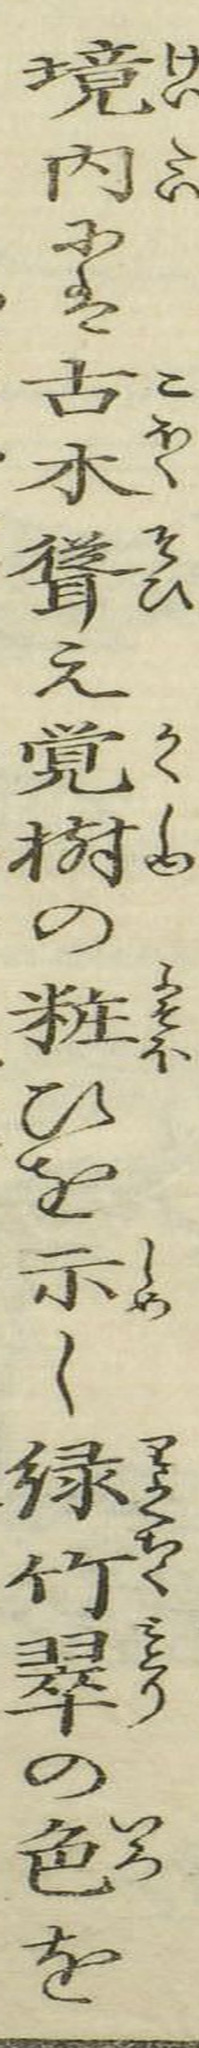境内には古木聳え覚樹の粧ひを示し緑竹翠の色を
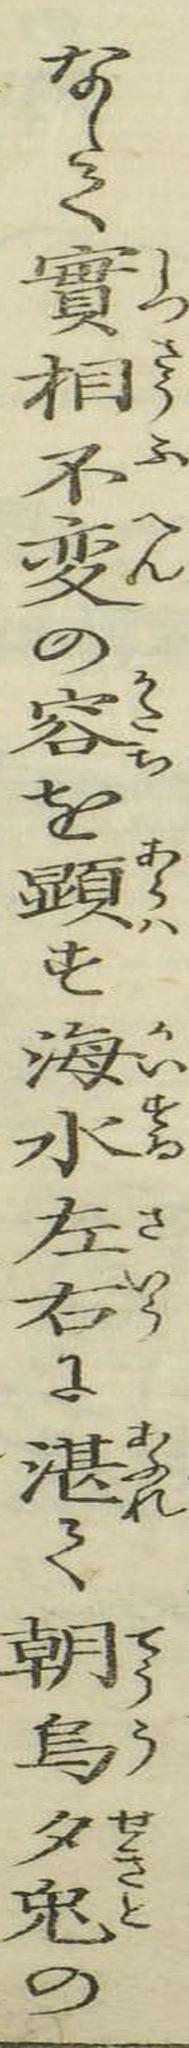なして實相不変の容を顕す海水左右に湛て朝烏夕兎の
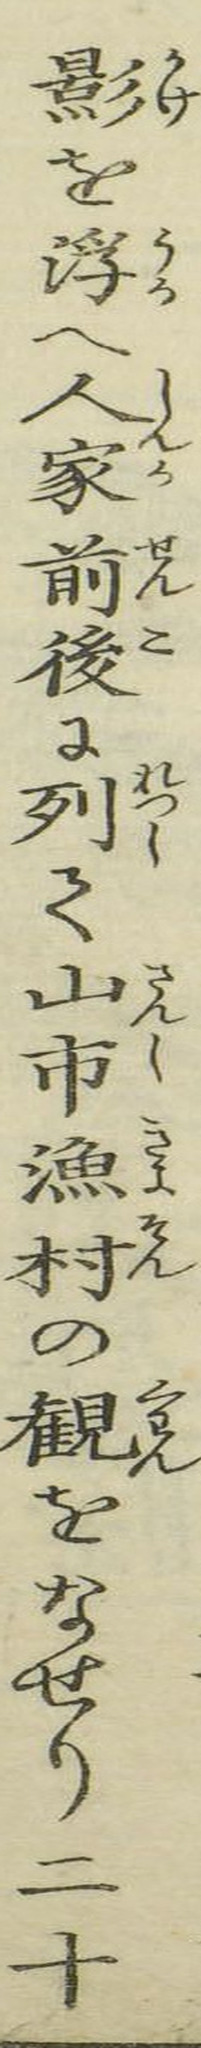影を浮へ人家前後に列て山市漁村の観をなせり二十

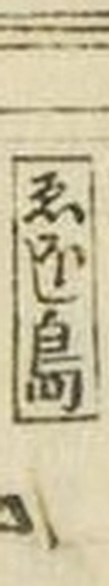ゑほし島
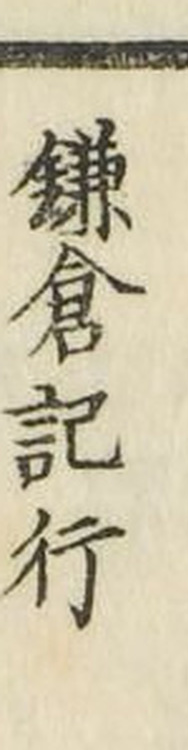鎌倉記行
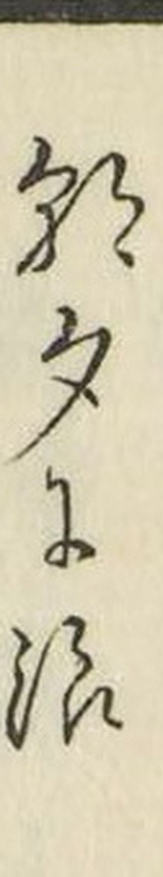朝夕に浪
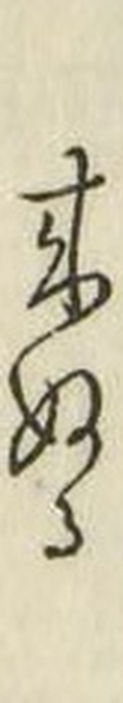来ぬる
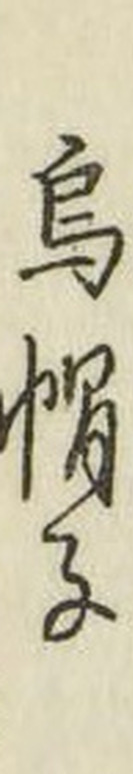烏帽子
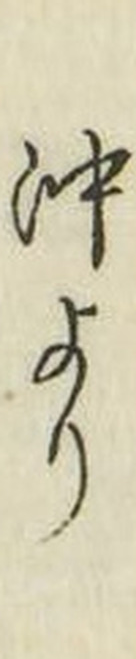沖より
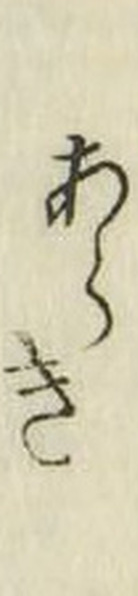あらき
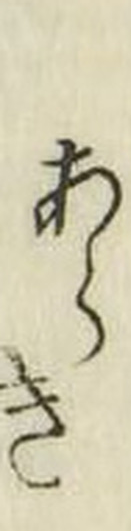あらき
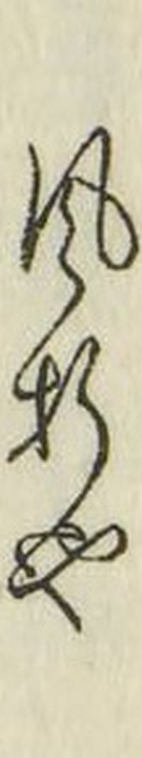風折や

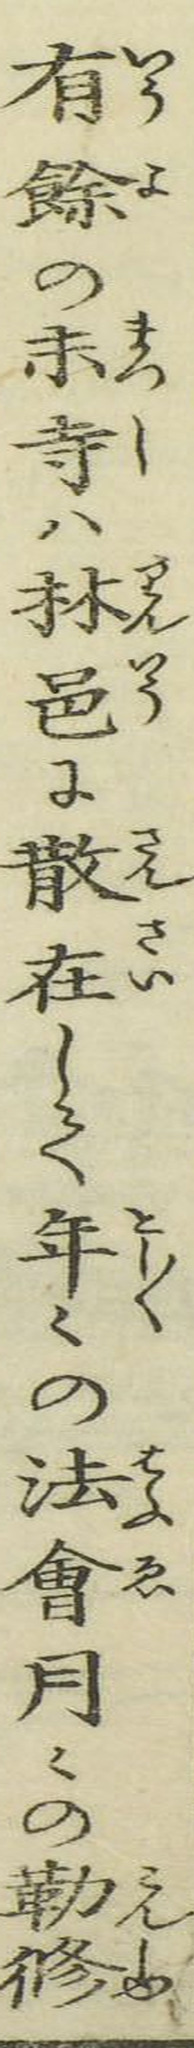有餘の末寺は林邑散在して年々の法會月々の勒修
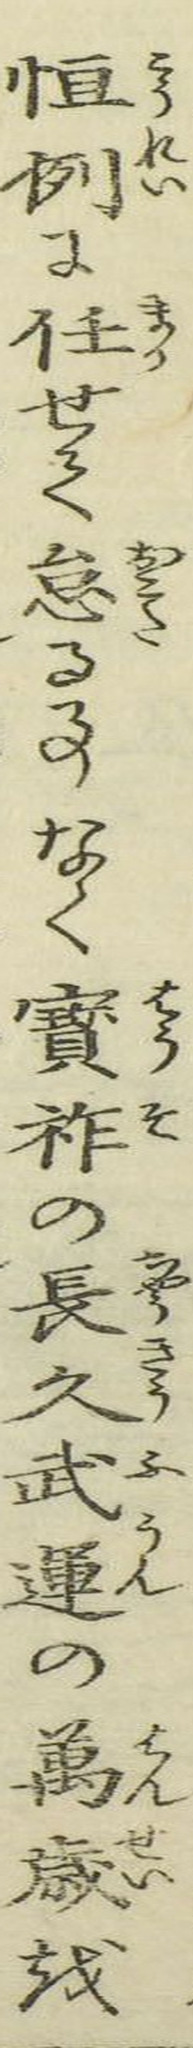恒例に任せて怠る事なく寶祚の長久武運の萬歳を
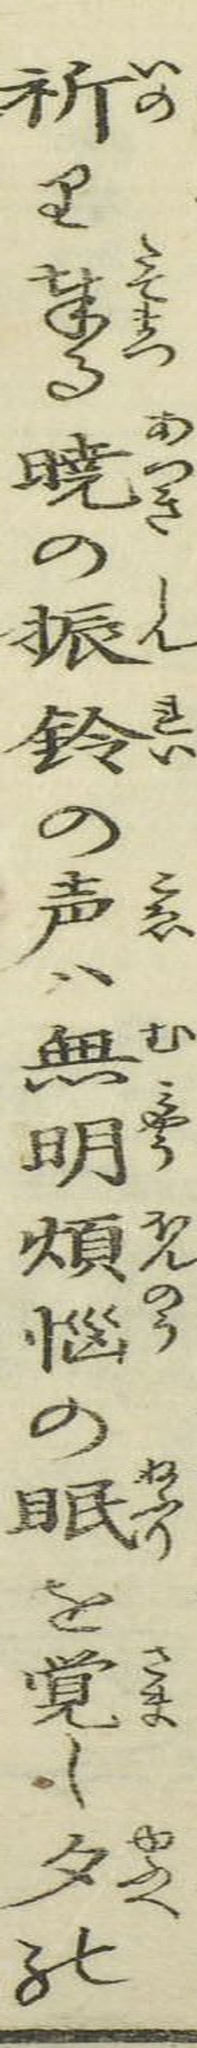祈り奉る暁の振鈴の声は無明煩惱の眠を覚し夕の
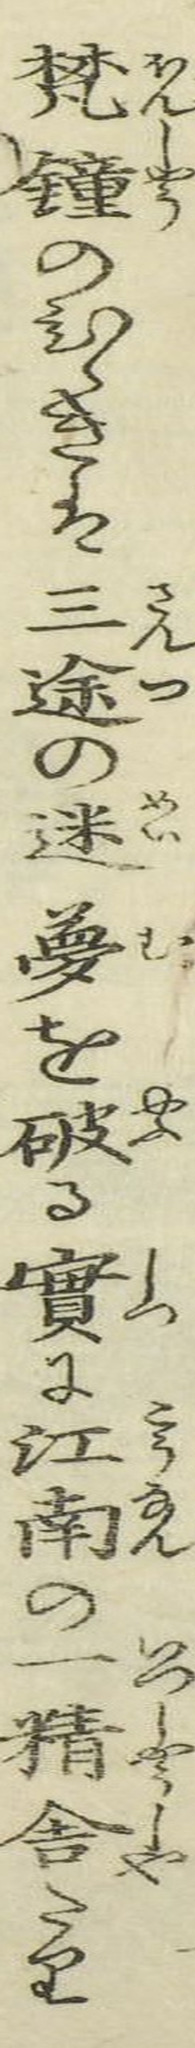梵鐘のひゝきは三途の迷夢を破る實に江南の一精舎たり
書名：江戸名所図会 20巻 巻之6
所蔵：東京学芸大学教育コンテンツアーカイブ
